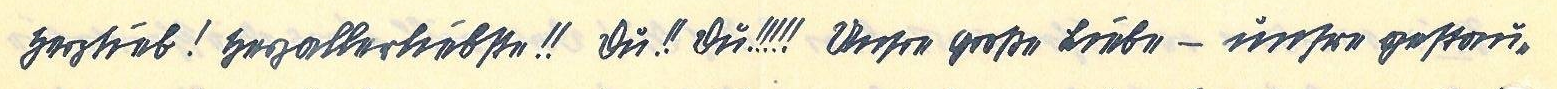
Herzlieb! Herzallerliebste!! Du!! Du!!!!! Unsre große Liebe – unsre gestau¬
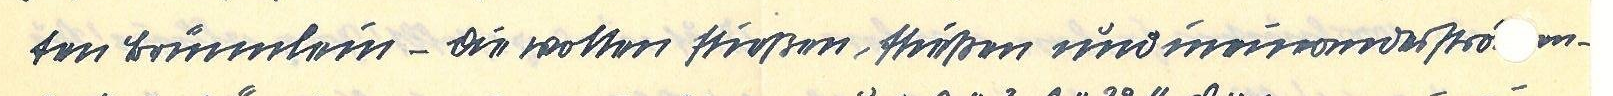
ten Brünnlein – die wollen fließen, fließen und ineinanderströen –
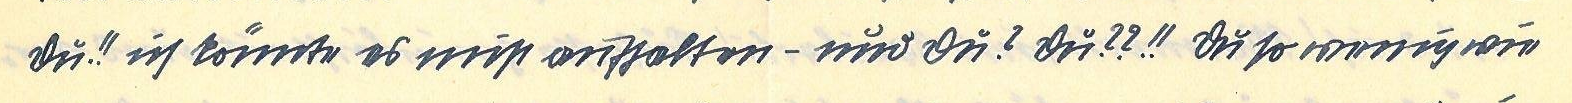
Du!! ich könnte es nicht aushalten – und Du? Du??!! Du so wenig wie
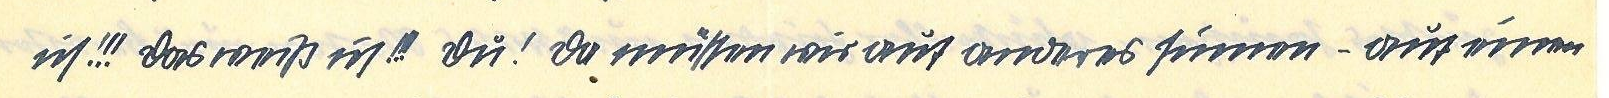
ich!!! Das weiß ich!!! Du! Da müssen wir auf anderes sinnen – auf einen
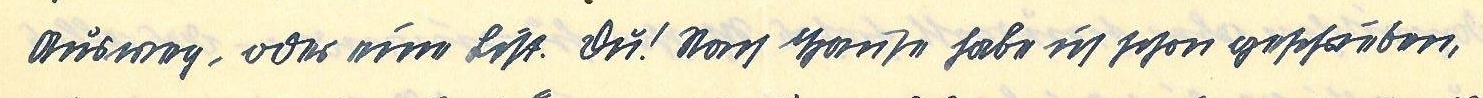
Ausweg, oder eine List. Du! Nach Hause habe ich schon geschrieben,
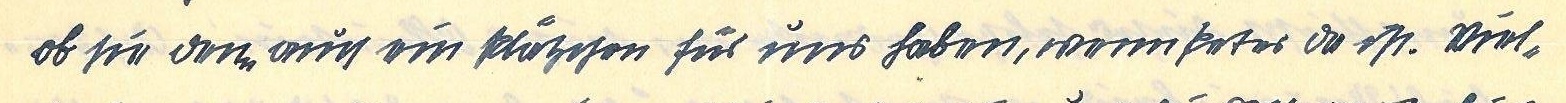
ob sie denn auch ein Plätzchen für uns haben, wenn P. da ist. Viel¬
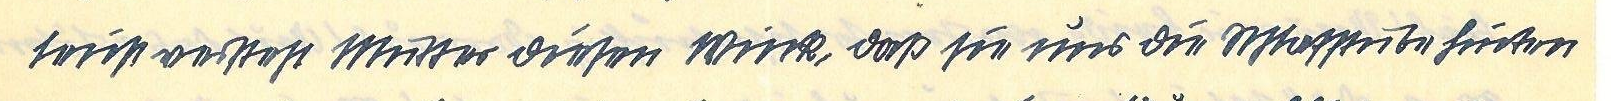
leicht versteht Mutter diesen Wink, daß sie uns die Schlafstube hinten
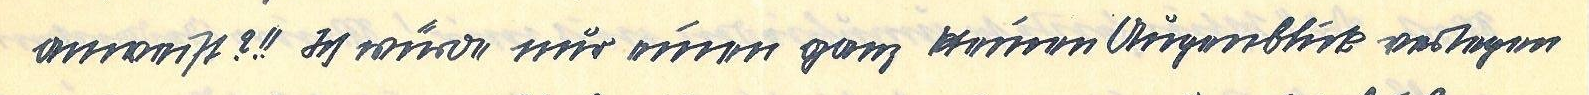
anweist?!! Ich würde nur einen ganz kleinen Augenblick verlegen
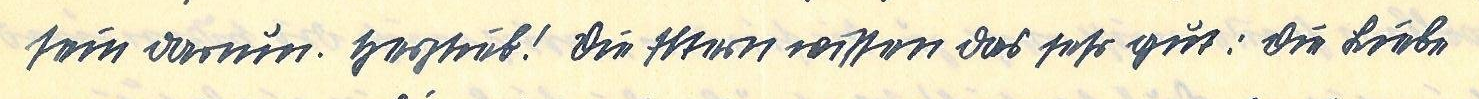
sein darum. Herzlieb! Die Eltern wissen das sehr gut: die Liebe
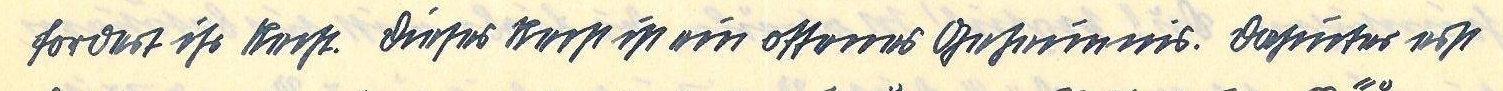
fordert ihr Recht. Dieses Recht ist ein offenes Geheimnis. Dahinter erst
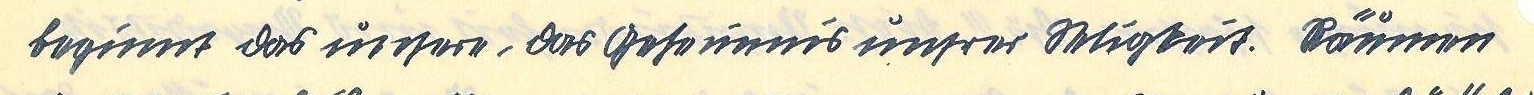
beginnt das unsere, das Geheimnis unsrer Seligkeit. Räumen
